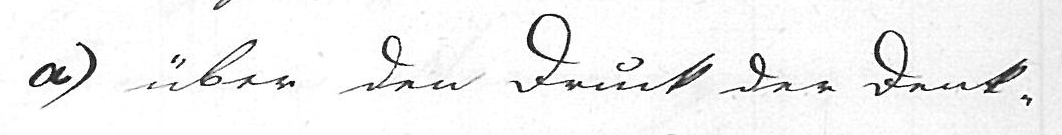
a) über den Druck der Denk-
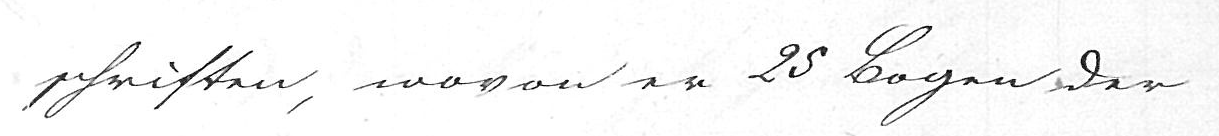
schriften, wovon er 25 Bogen der
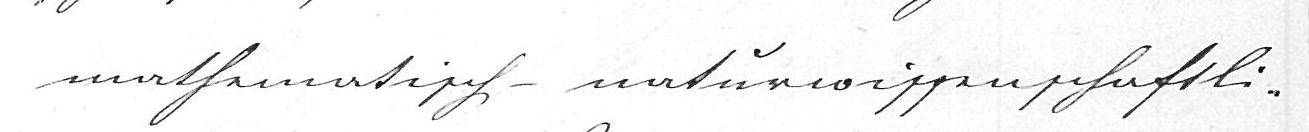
mathematisch-naturwissenschaftli-
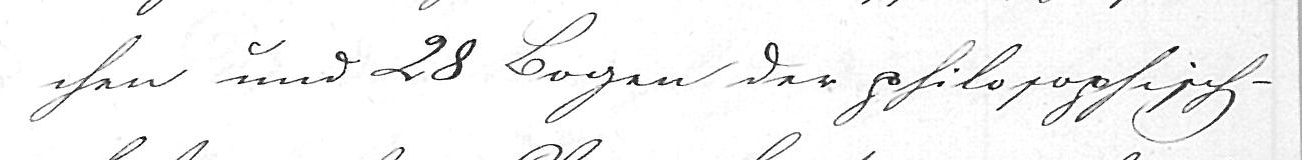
chen und 28 Bogen der philosophisch-
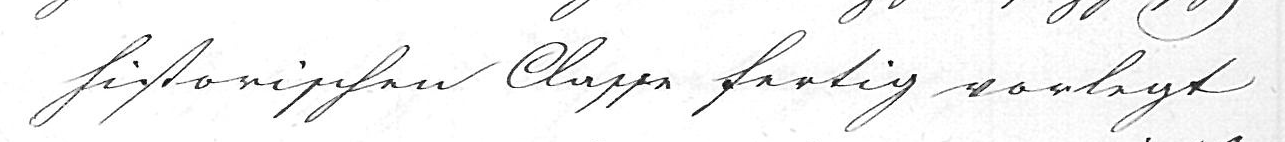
historischen Classe fertig vorlegt
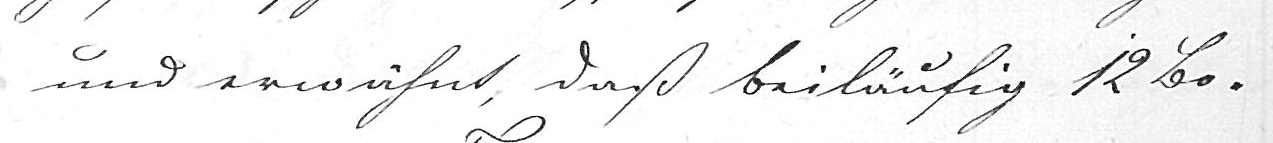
und erwähnt, daß beiläufig 12 Bo-
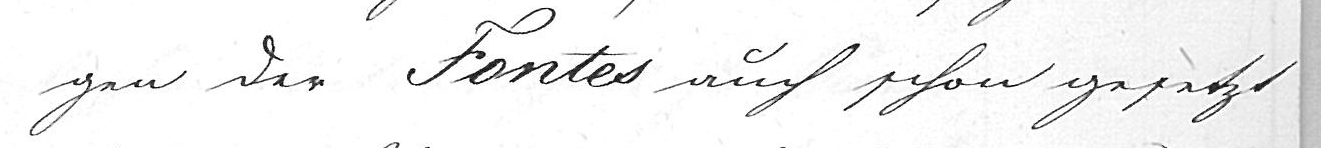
gen der Fontes auch schon gesetzt
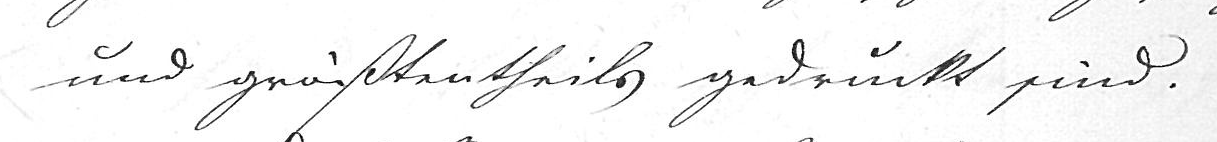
und größtentheils gedruckt sind.
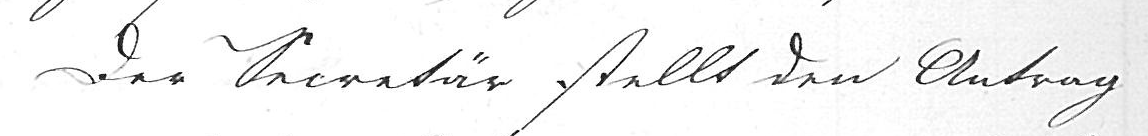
Der Secretär stellt den Antrag
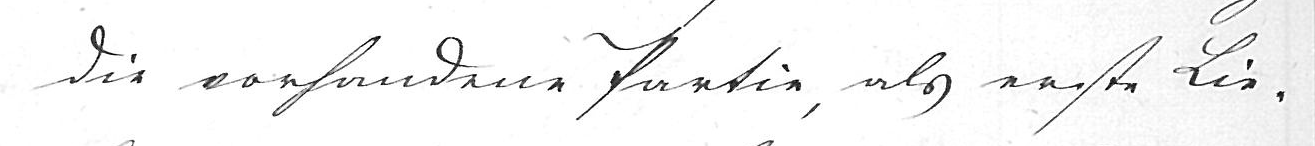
die vorhandene Partie, als erste Lie-
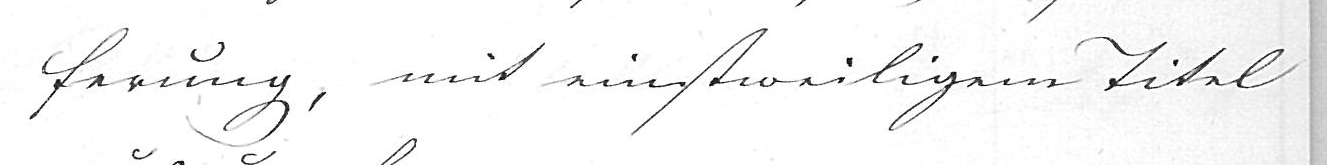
ferung, mit einstweiligen Titel
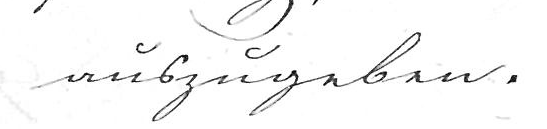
auszugeben.
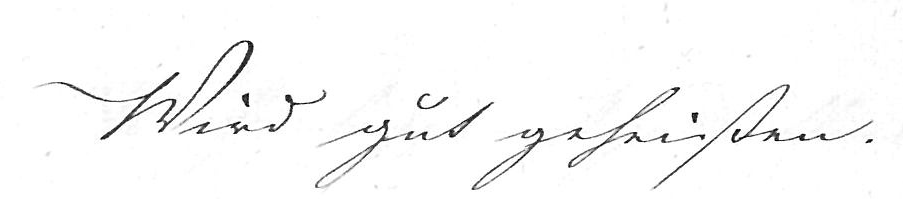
Wird gut geheißen.
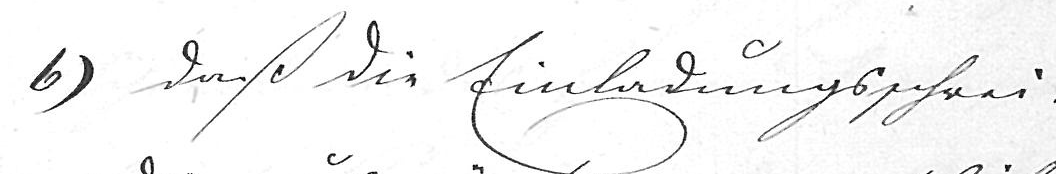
b) daß die Einladungsschrei-
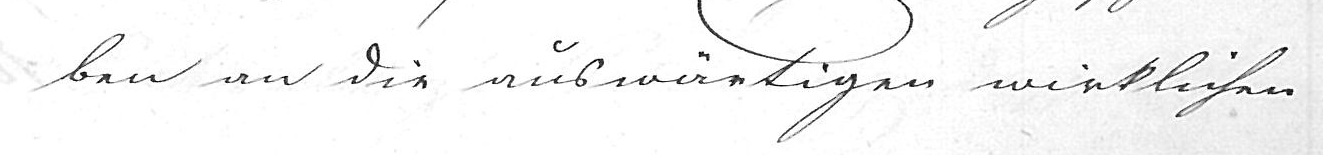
ben an die auswärtigen wirklichen
